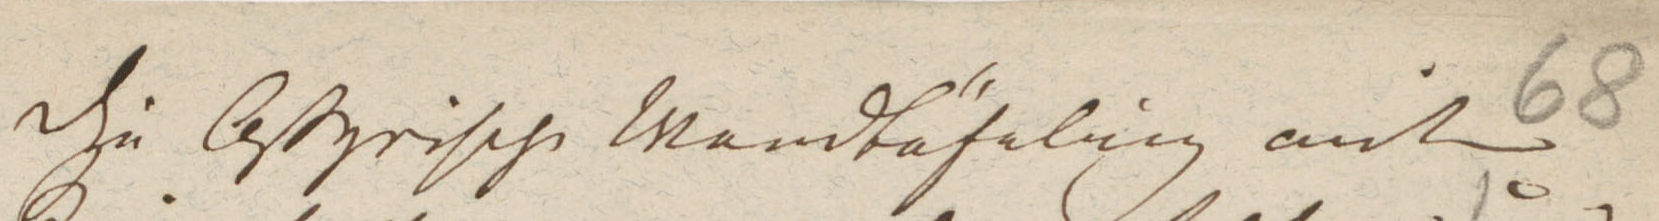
Die Assyrische Wandtäfelung mit
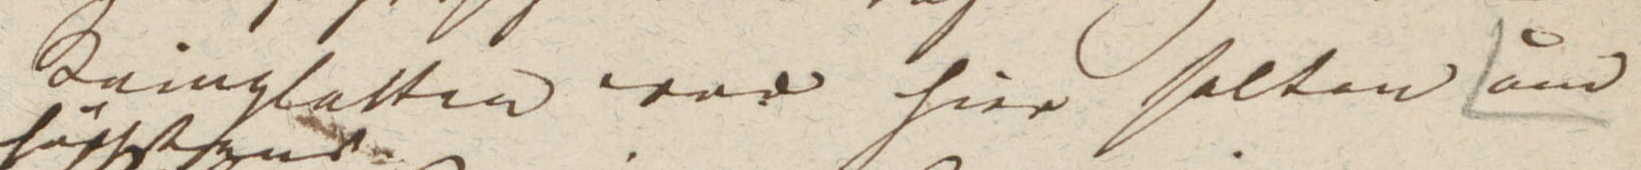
Steinplatten war hier selten % und
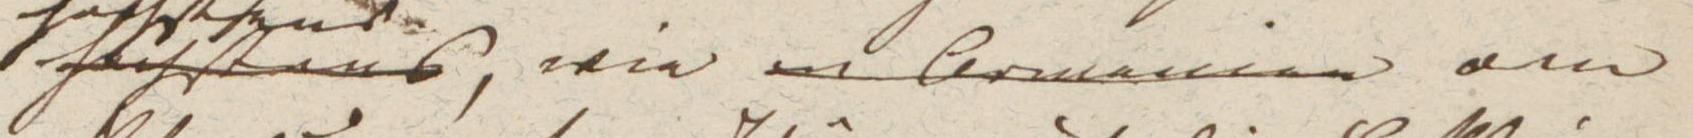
höchstens, wie in Armenien am
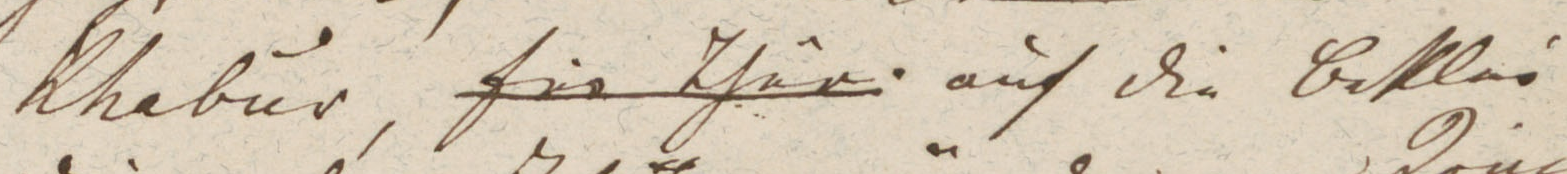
Khabur, für Thür auf die Beklei-
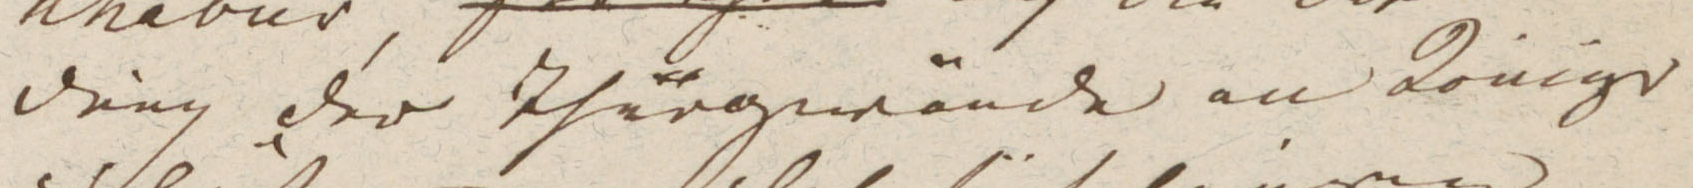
dung der Thuürgewände an Königs
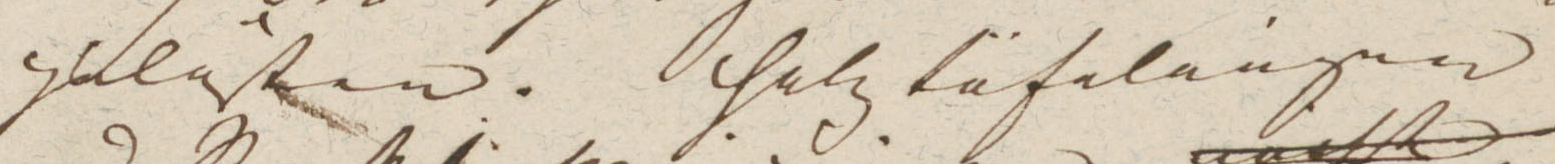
palästen. Holz täfelungen
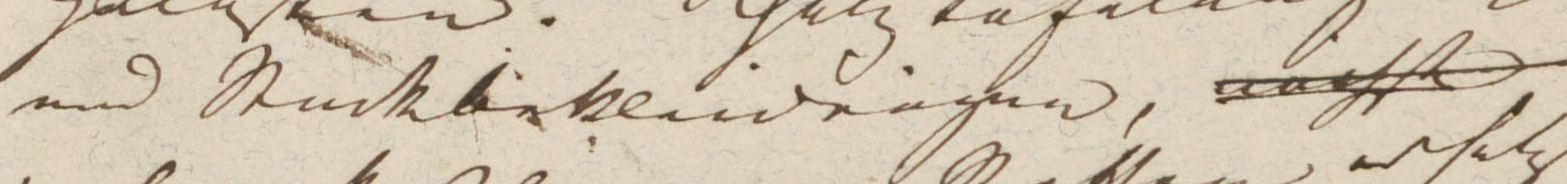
und Stuckbekleidungen, nächst
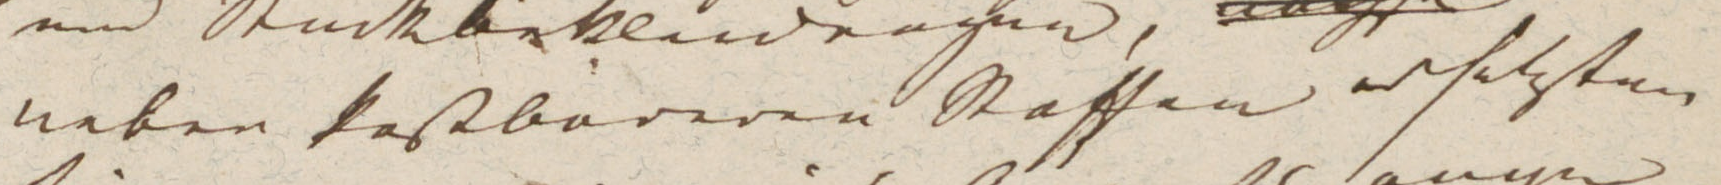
neben kostbaren Stoffen ersetzten
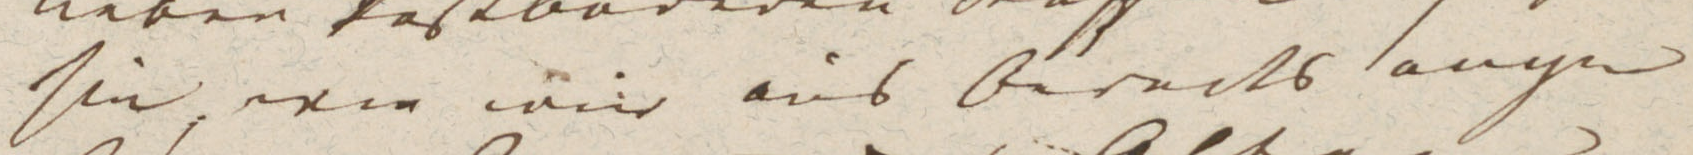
sie, wie wir aus bereits ange
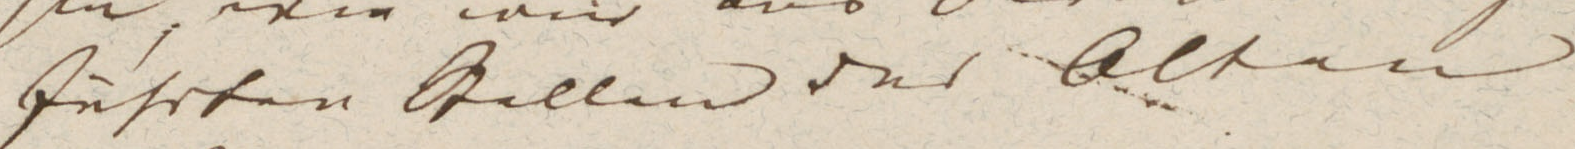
führten Stellen der Alten
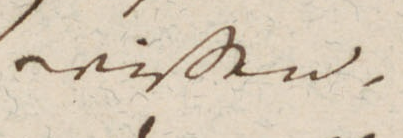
wissen.
